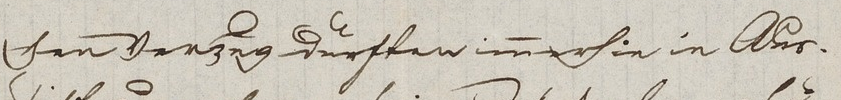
chen Verzug dürften immerhin in Aus-
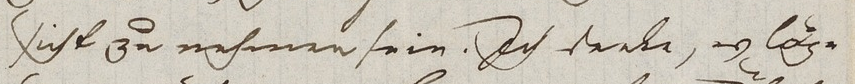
sicht zu nehmen sein. Ich denke, es läge
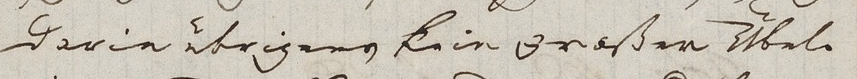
darin übrigens kein großer Übel-
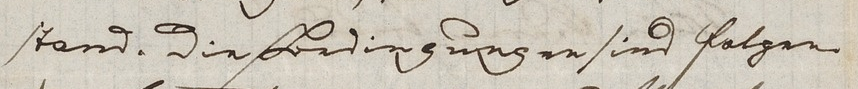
stand. Die Bedingungen sind folgen-
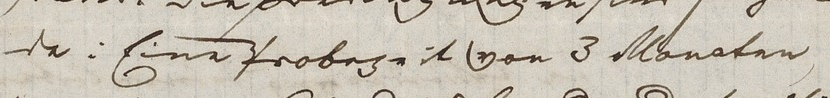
de: Eine Probezeit von 3 Monaten,,
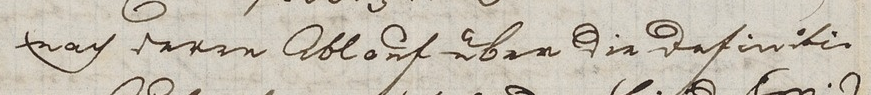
nach deren Ablauf über die definiti-
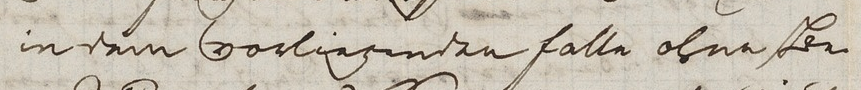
in dem vorliegenden Falle ohne Be-
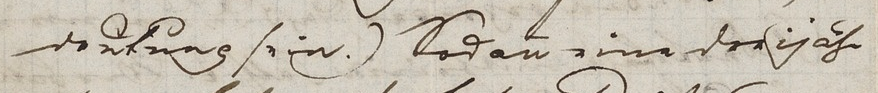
deutung sein.) Sodann eine dreijäh-
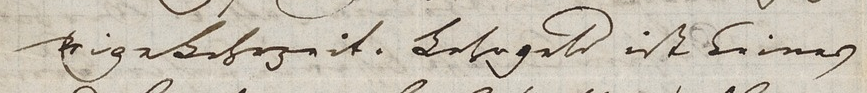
rige Lehrzeit. Lehrgeld ist keines
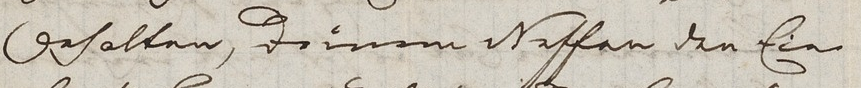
gehalten, Deinem Neffen den Ein-
